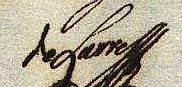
de Larre
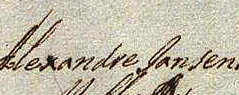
Alexandre Iansen
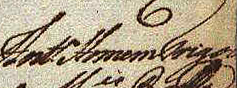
Anto Homem Frigo
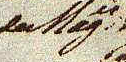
de Mag.es
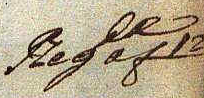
Reg.da a f 12
